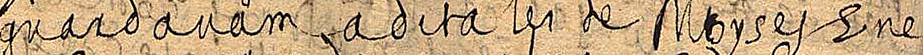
guardauam a dita lei de Moyses E ne
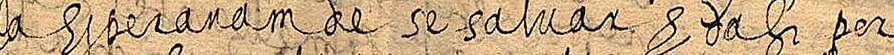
la Esperauam de se saluar E dahi per
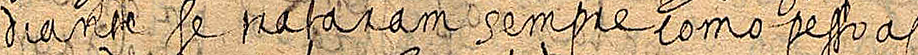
diante se trataram sempre como pessoas
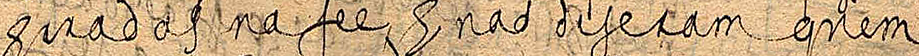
Erradas na fee, E naõ diseram quem
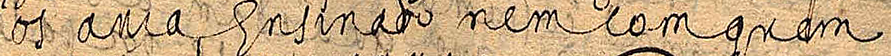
os auia Ensinado nem com quem
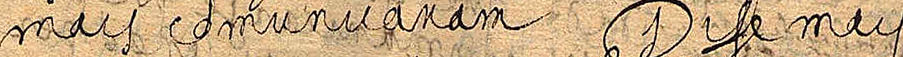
mais cōmunicauam Dise mais
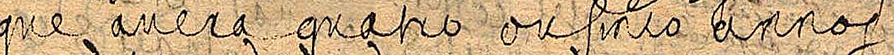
que auera quatro ou sinco annos
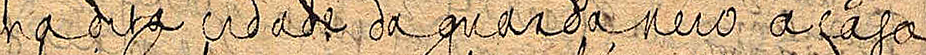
na dita cidade da guarda ueio a casa
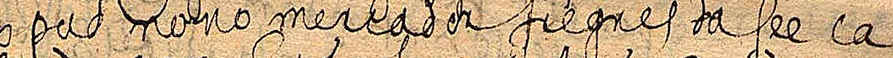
xpaõ nouo mercador fregues da see ca
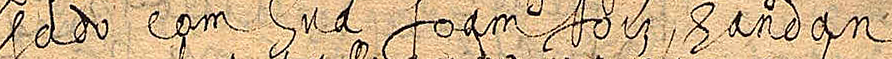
sado com huā foam Roiz̄, E andan
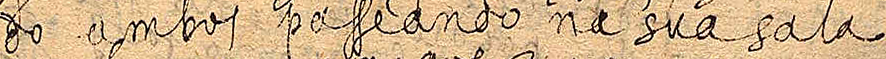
do ambos passeando na sua sala
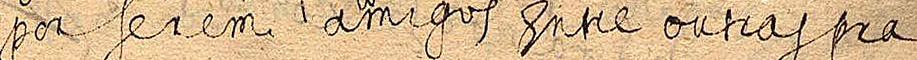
por serem amigos Entre outras pra
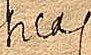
ticas
